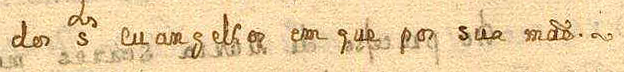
dos Stos euangelhos em que pos sua mãoaõ.
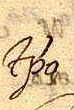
tp̄o
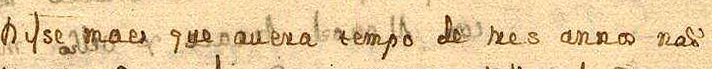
Disse maes que auera tempo de tres annos naõ
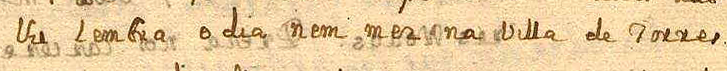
lhe lembra o dia nem mez na villa de Torres
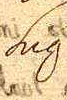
Lug
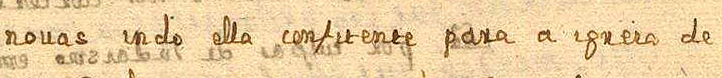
nouas indo ella confitente para a igreia de
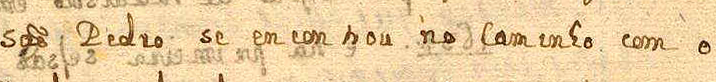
são Pedro se encontrou no Caminho com o
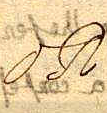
o R
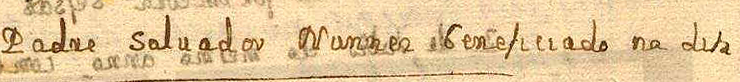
Padre Saluador Nunnez beneficiado na dita
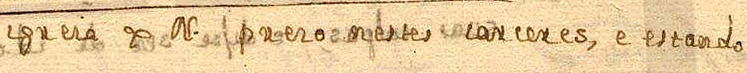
igreia x N. prezo nestes carceres, e estando
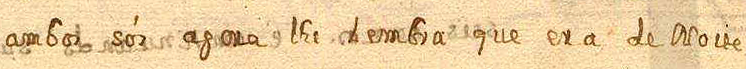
ambos sós agora lhe lembra que era de Noite
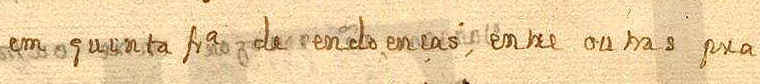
em quinta fra de endoenças, entre outras pra
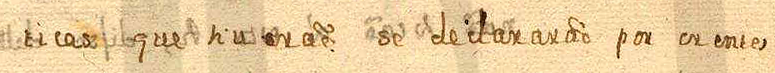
ticas que tiueraõ se declararãoaõ por crentes
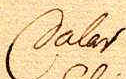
Declar
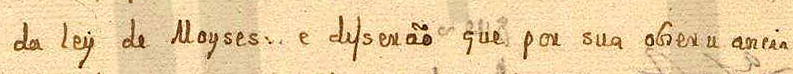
da ley de Moyses. e desserão que por sua obseruancia
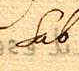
Sab
